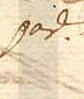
por.e
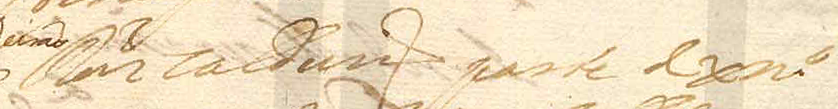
Roiz caldeiraõ parte d x n.o
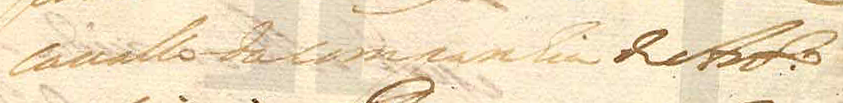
cauallo da companhia de Ant.o
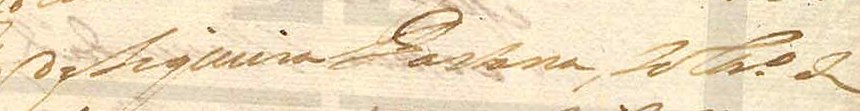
de Siqueira Pastana, soltr.o de
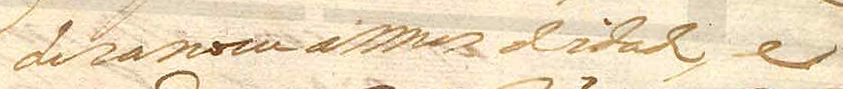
dezanoue annos didade, e
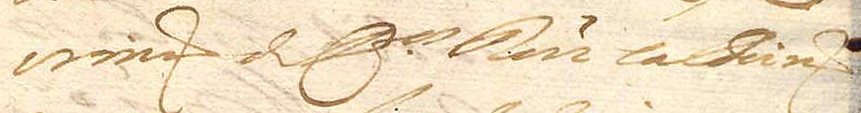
irmaõ de D.os Roiz̄ caldeiraõ
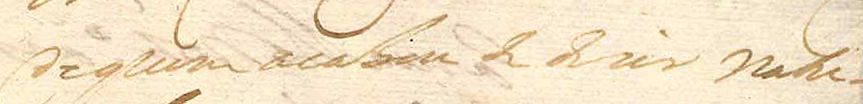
de quem acabou de dizer natu
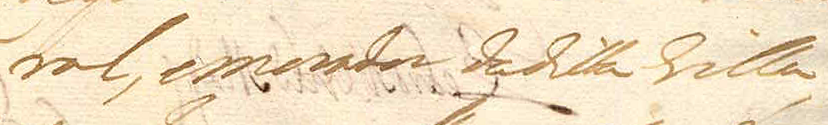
ral, e morador da ditta Villa
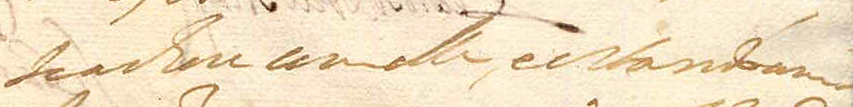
se achou com elle, e estando am
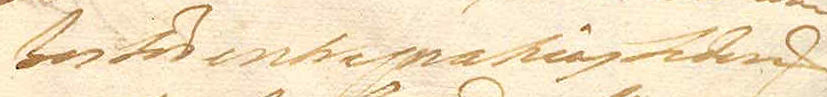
bos sós entre praticas se deraõ
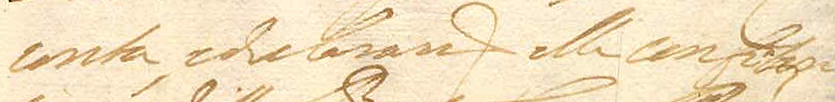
conta e declararaõ elle confiten
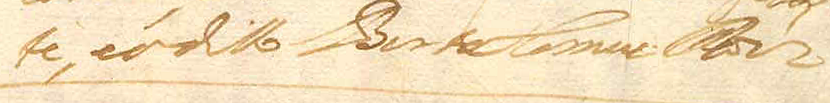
te, e o dito Bertolomeu Roiz̄
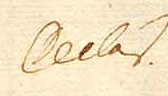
Declar.
